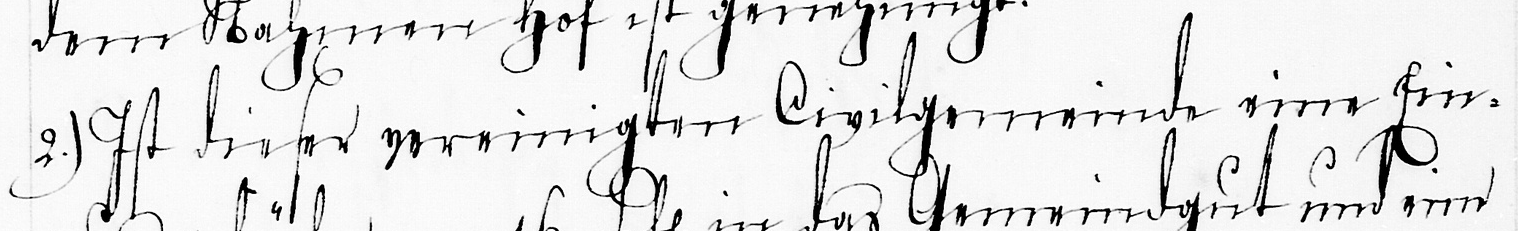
2.) Ist dieser vereinigten Civilgemeinde eine Ein¬
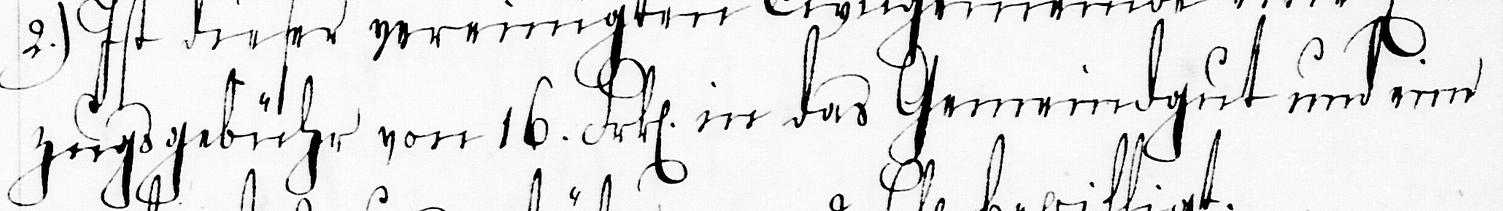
zugsgebühr von 16. Frk[en]. in das Gemeindgut und eine
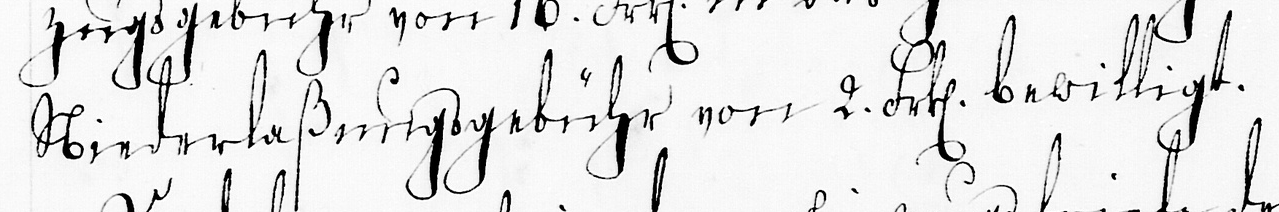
Niederlaßungsgebühr von 2. Frk[en]. bewilligt.
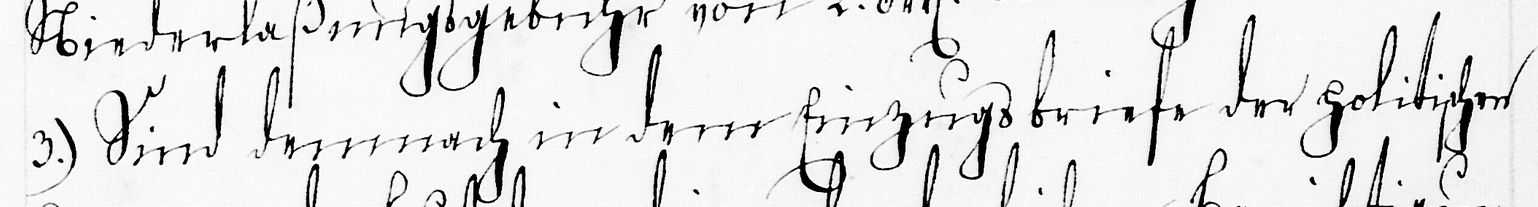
3.) Sind demnach in dem Einzugsbriefe der politischen
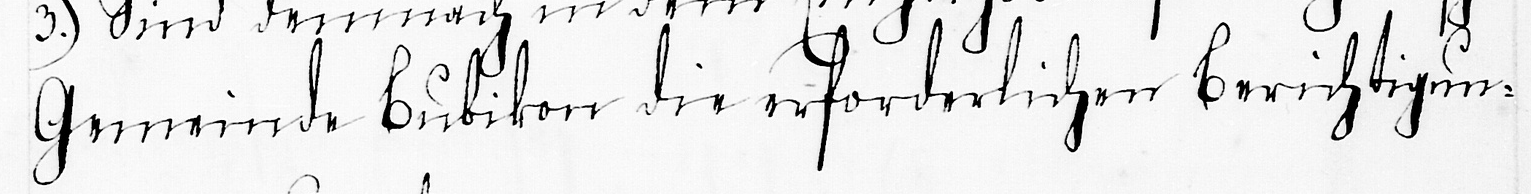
Gemeinde Bubikon die erforderlichen Berichtigun¬
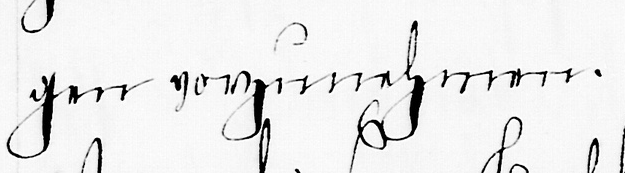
gen vorzunehmen.
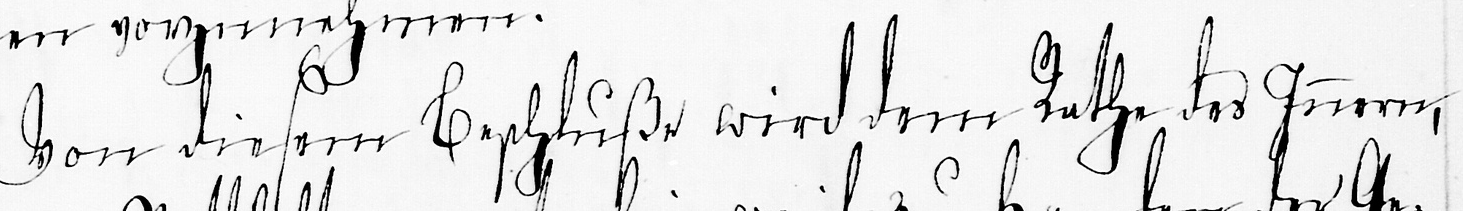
Von diesem Beschluße wird dem Rathe des Innern,
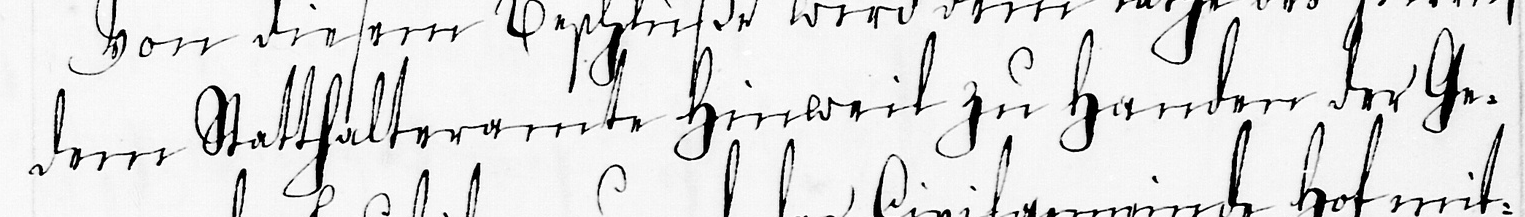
dem Statthalteramte Hinweil zu Handen der Ge¬
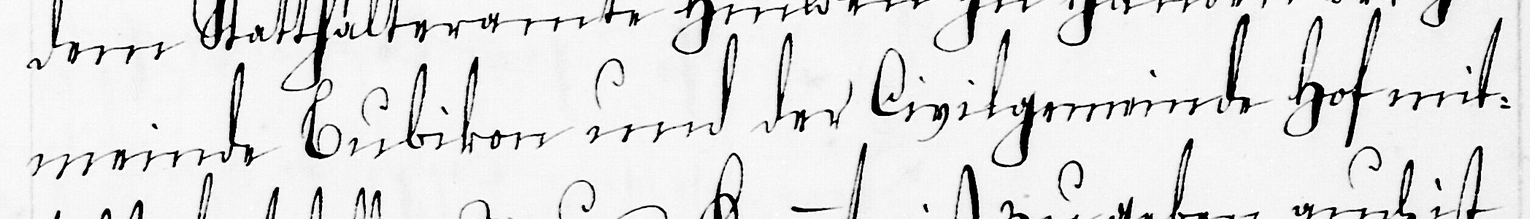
meinde Bubikon und der Civilgemeinde Hof mit¬
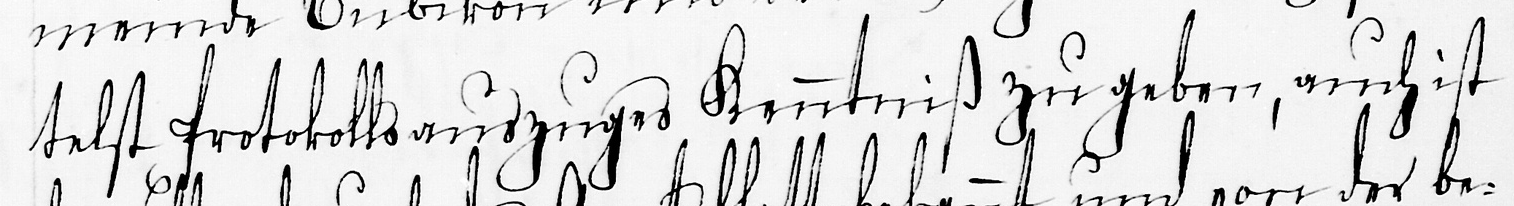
telst Protokollsauszuges Kenntniß zu geben, auch ist
